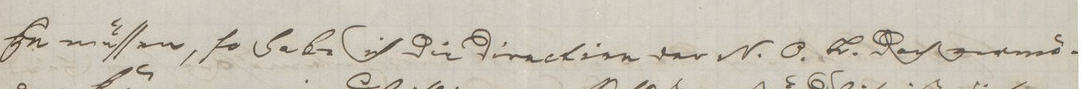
zu müssen, so habe ich die Direction der N.O.B. doch vermö-
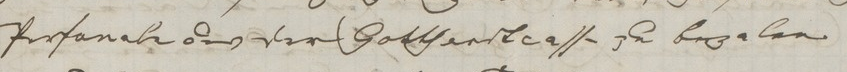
Personale aus der Gotthardtcasse zu bezalen.
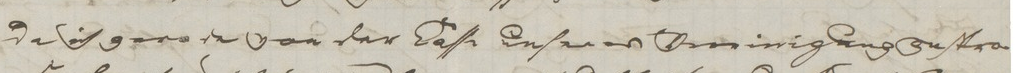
Da ich gerade von der Casse unserer Vereinigung gespro-
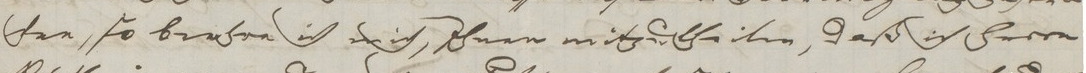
chen, so beehre ich mich, Ihnen mitzutheilen, daß ich Herrn
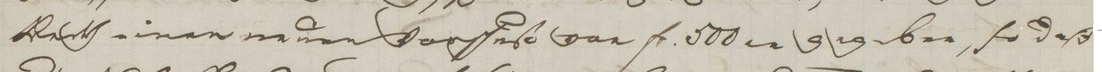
Beckh einen neuen Vorschuß von Fr. 500 .– gegeben, so daß
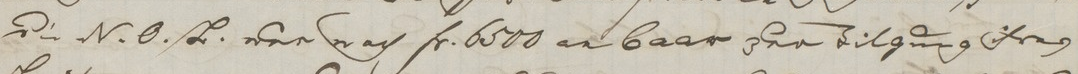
die N.O.B. nur noch fr. 6500 an baar zur Tilgung ihres
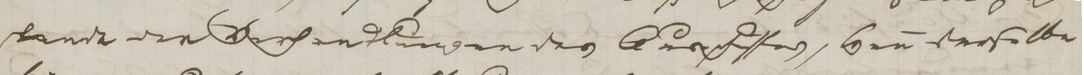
stande der Verhandlungen des Ausschusses, wenn derselbe
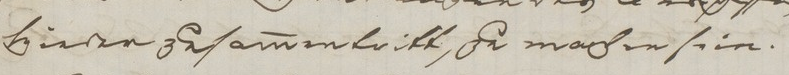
wieder zusammentritt, zu machen sein.
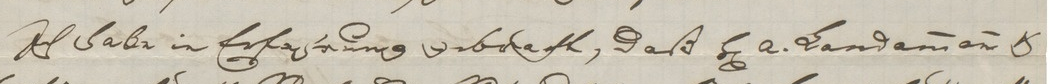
Ich habe in Erfahrung gebracht, daß Herr a. Landammann &
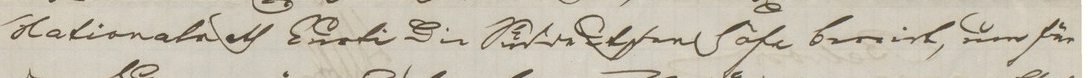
Nationalrath Curti die Süddeutschen Höfe bereist, um für
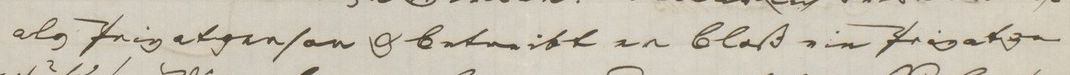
als Privatperson & betreibt er bloß ein Privatge-
